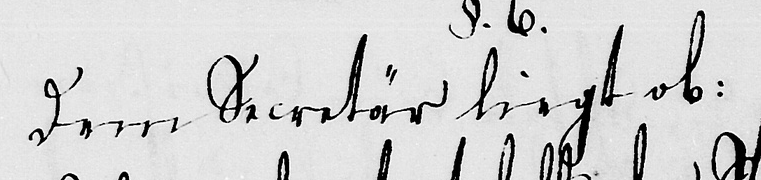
Dem Secretär liegt ob:
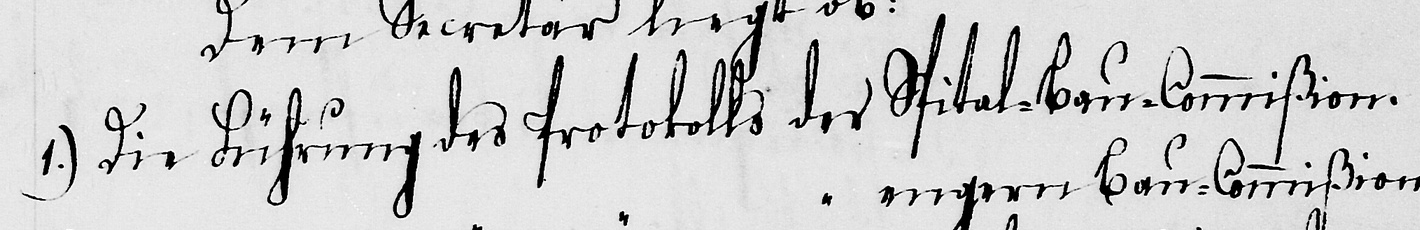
1.) Die Führung des Protokolls der Spital-Bau-Commißion.
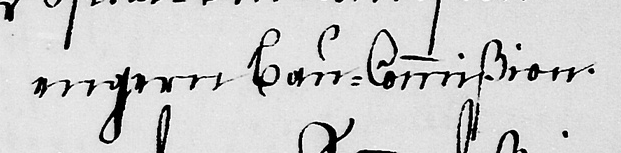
engern Bau-Commißion.
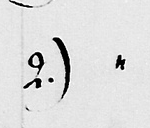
3.)
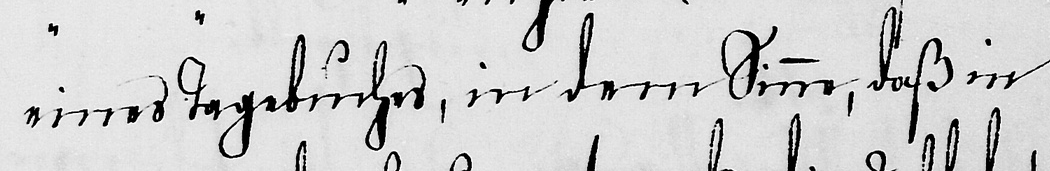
eines Tagebuches, in dem Sinne, daß in
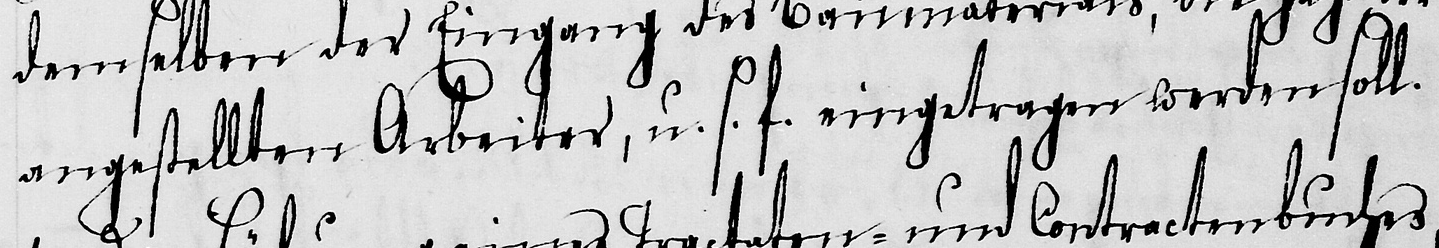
angestellten Arbeiter, u. s. f, eingetragen werden soll.
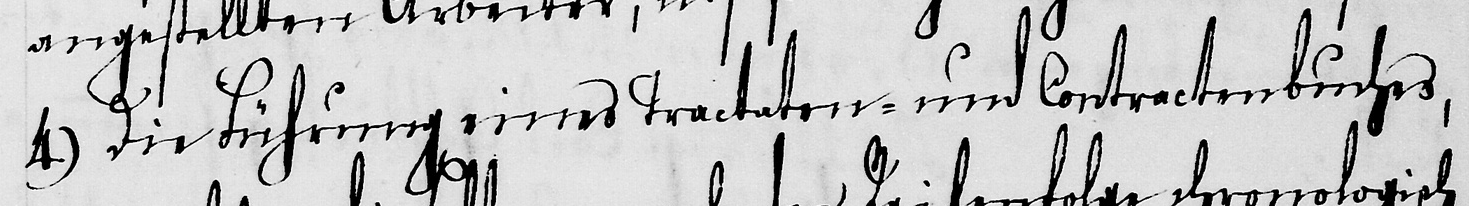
4.) Die Führung eines Tractaten- und Contractenbuches,
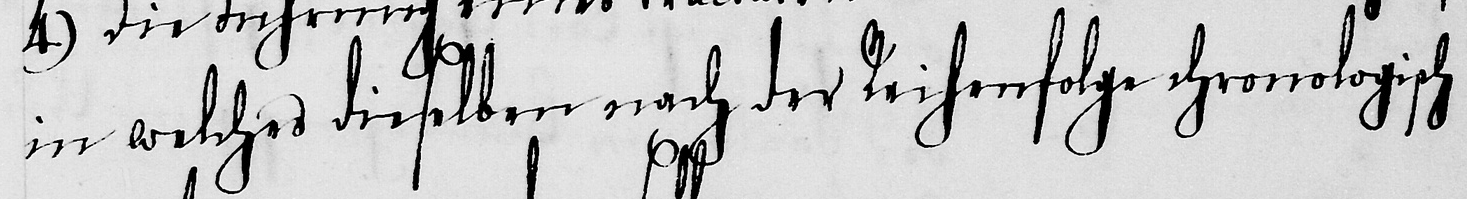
in welches dieselben nach der Reihenfolge chronologisch
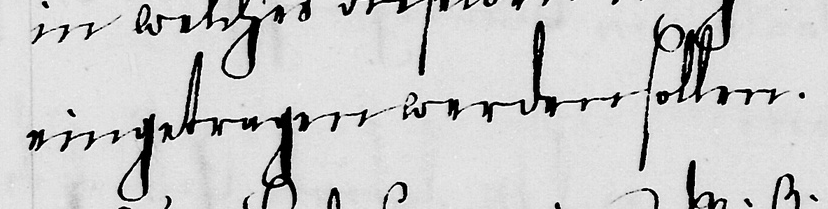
eingetragen werden sollen.
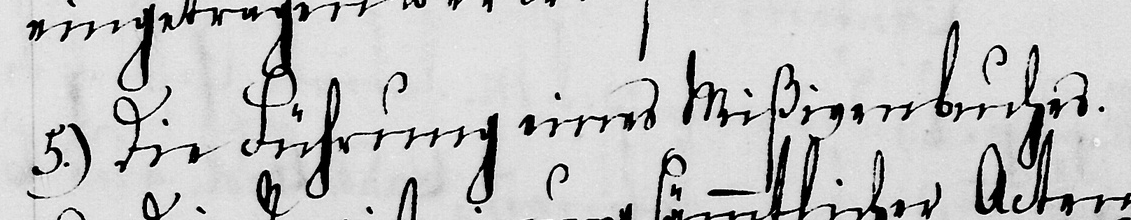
5.) Die Führung eines Mißivenbuches.
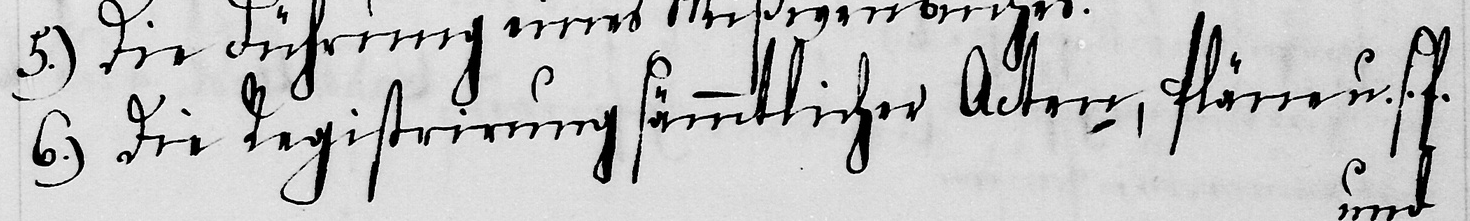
6.) Die Registrirung sämmtlicher Acten, Pläne u. s.
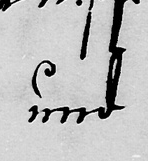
der
